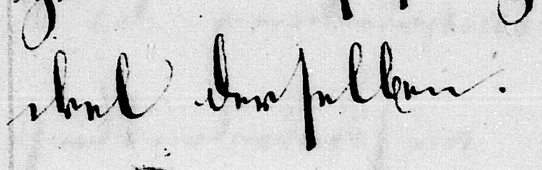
ckel derselben.
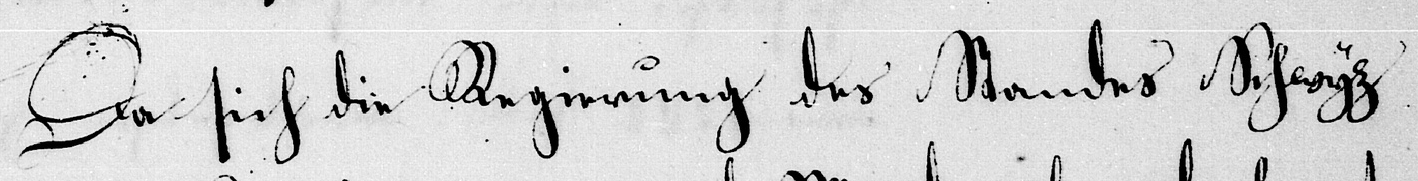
Da sich die Regierung des Standes Schwyz
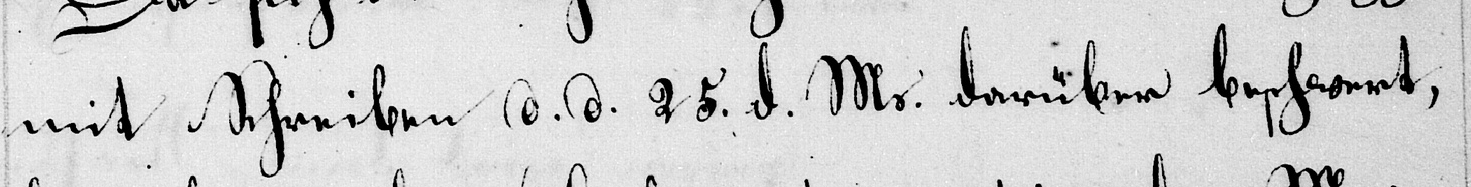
mit Schreiben d. d. 25. d. Ms. darüber beschwert,
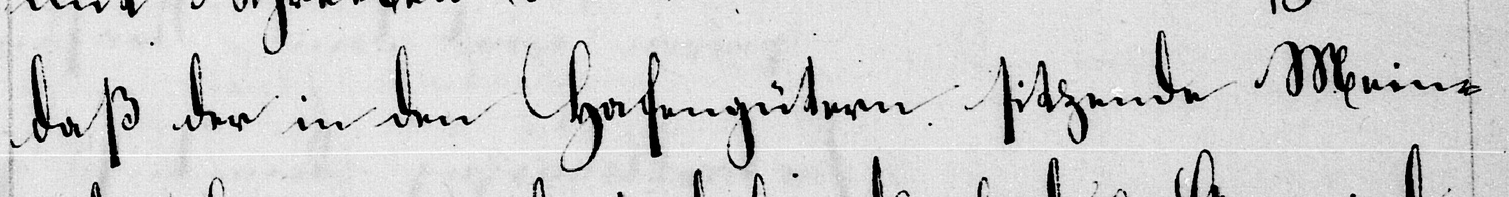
daß der in den Hafengütern sitzende Mein¬
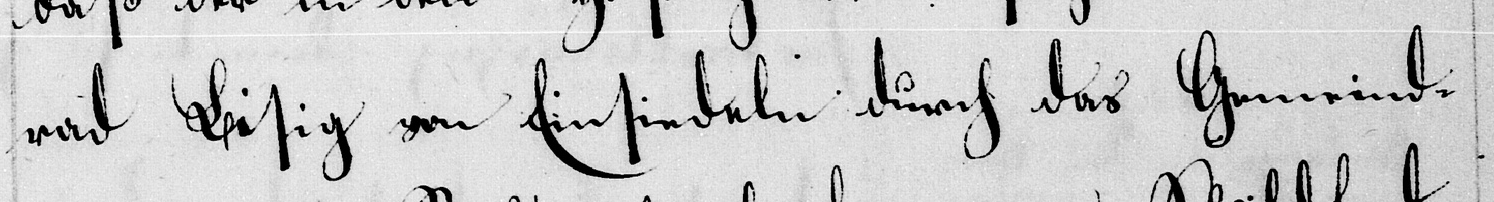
rad Bisig von Einsiedeln durch das Gemeind¬
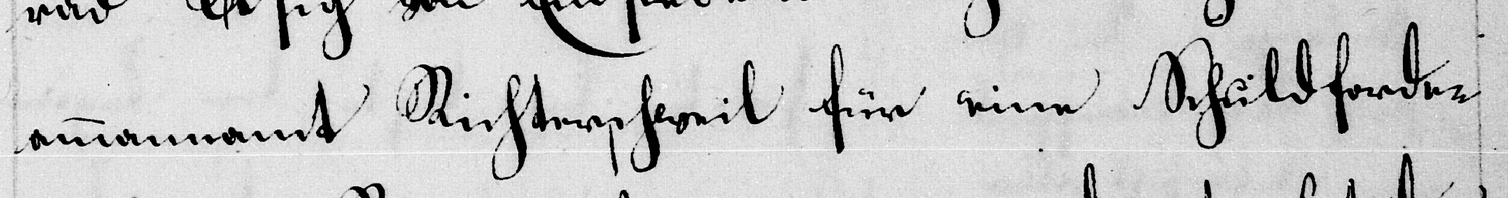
ammannamt Richterschweil für eine Schuldforde¬
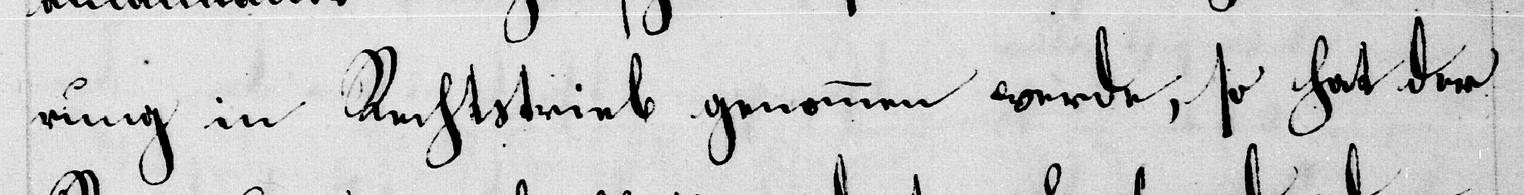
rung in Rechtstrieb genommen wurde, so hat der
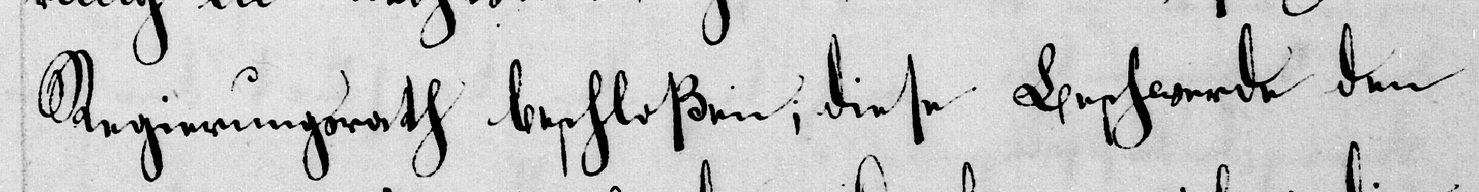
Regierungsrath beschloßen, diese Beschwerde den
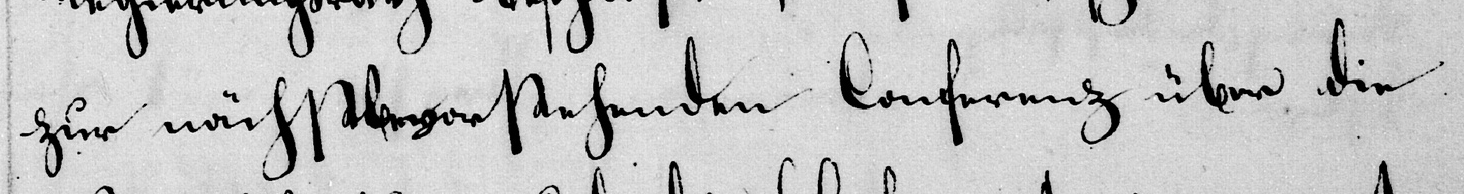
zur nächstbevorstehenden Conferenz über die
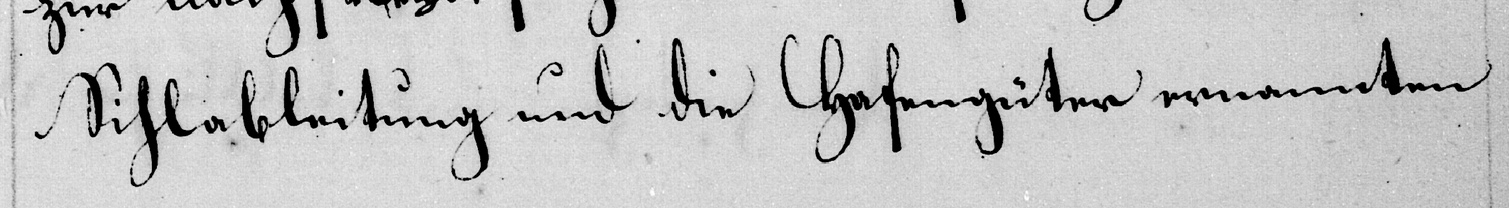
Sihlableitung und die Hafengüter ernannten
